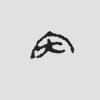內
